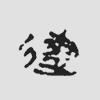失
